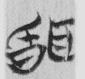䎽
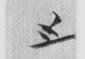之
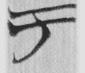于
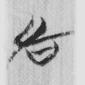左
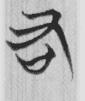右
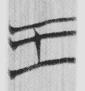王
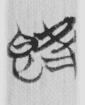旣
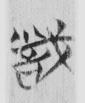{小言戈}
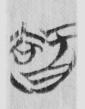智
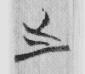之
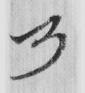乃
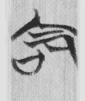命
